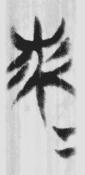桼=
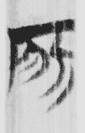所
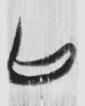㠯（以）
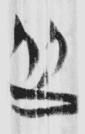{从止}
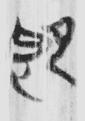即
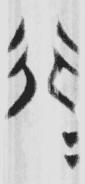行=
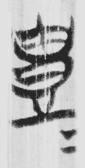豊=
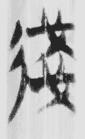{彳戔}
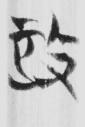政
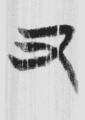又
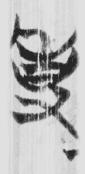事
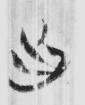出
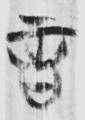言
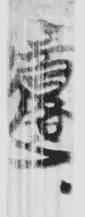{後口}
